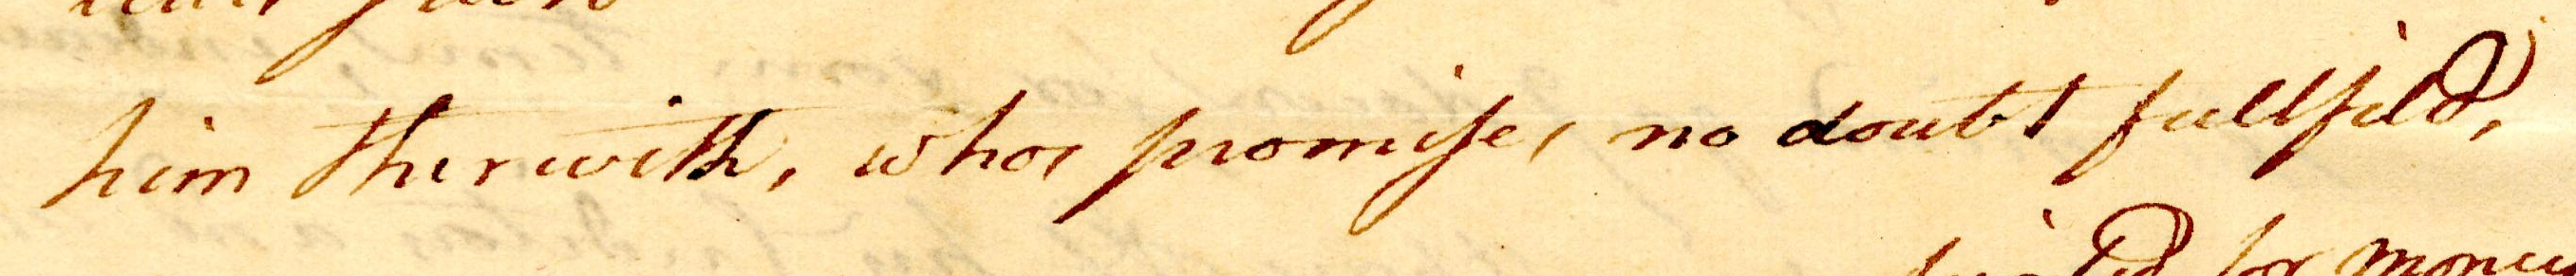him therwith, whos promises no doubt fulfilld,
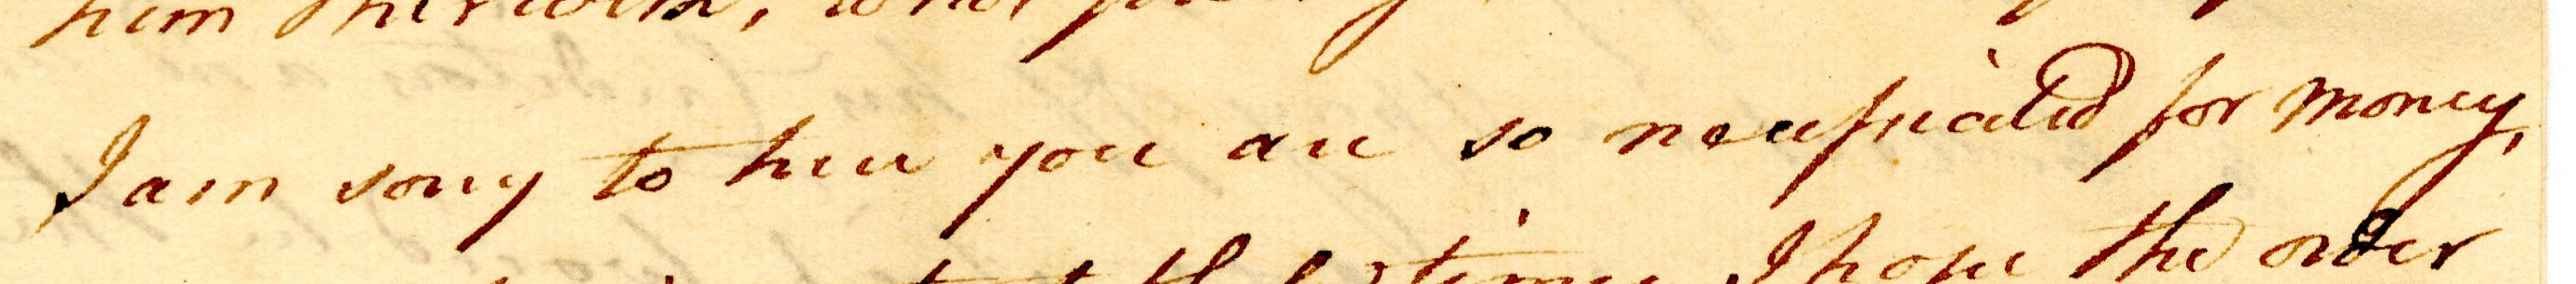I am sorry to here you are so necessitated for money,
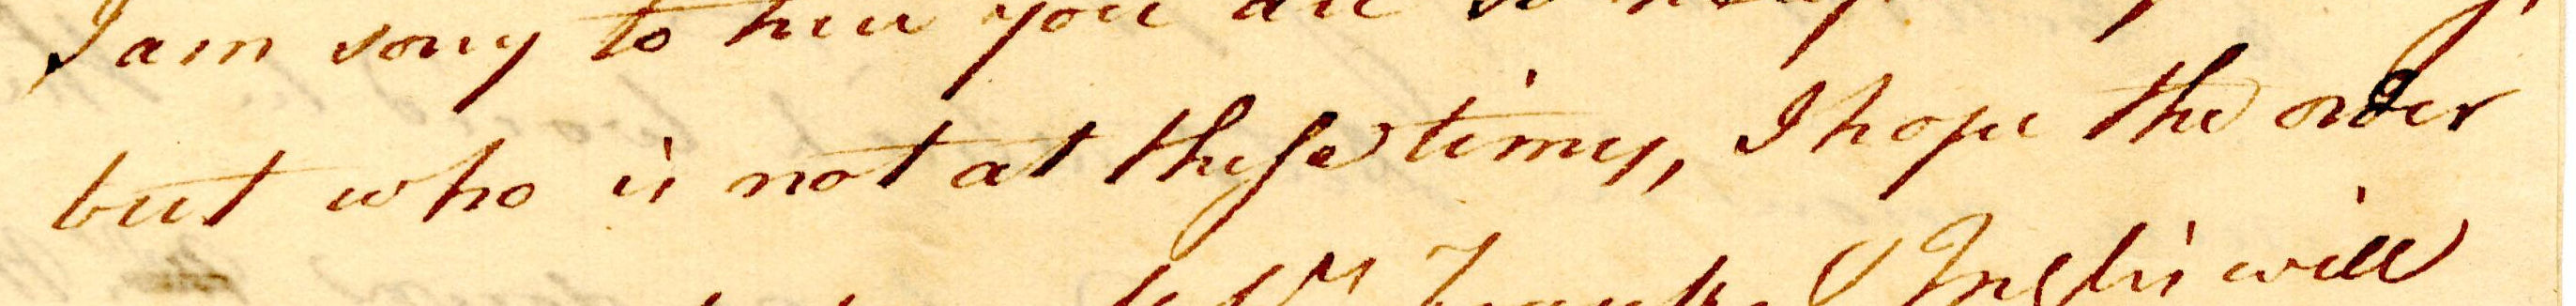but who is not at these times, I hope the order
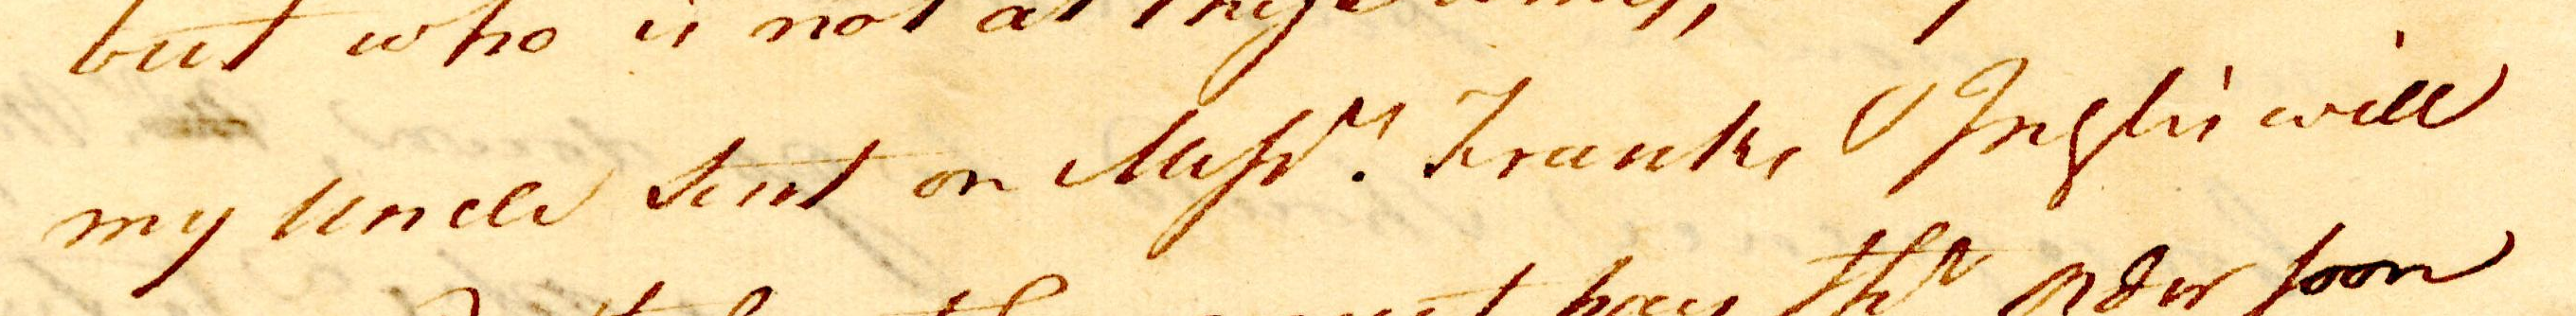my uncle sent on Maj^r. Frank Inglis will
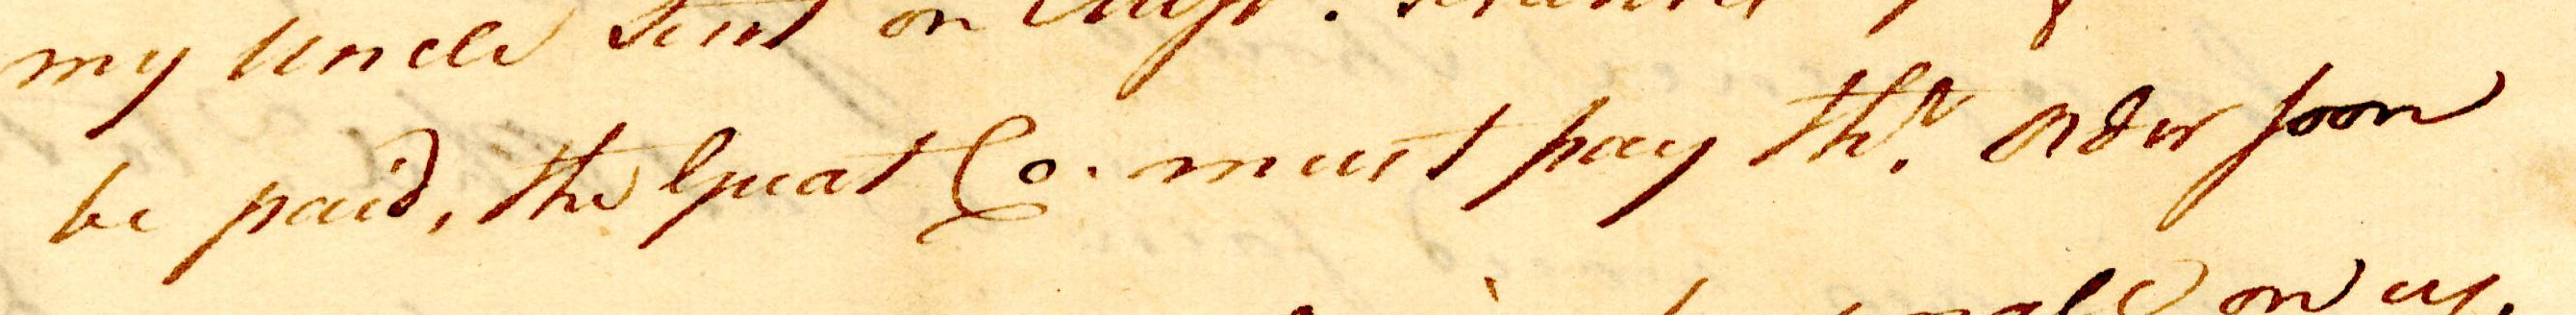be paid, the Geat Co. must pay th^r. order soon
